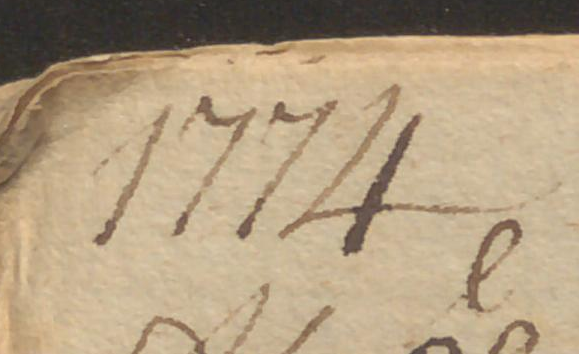1774
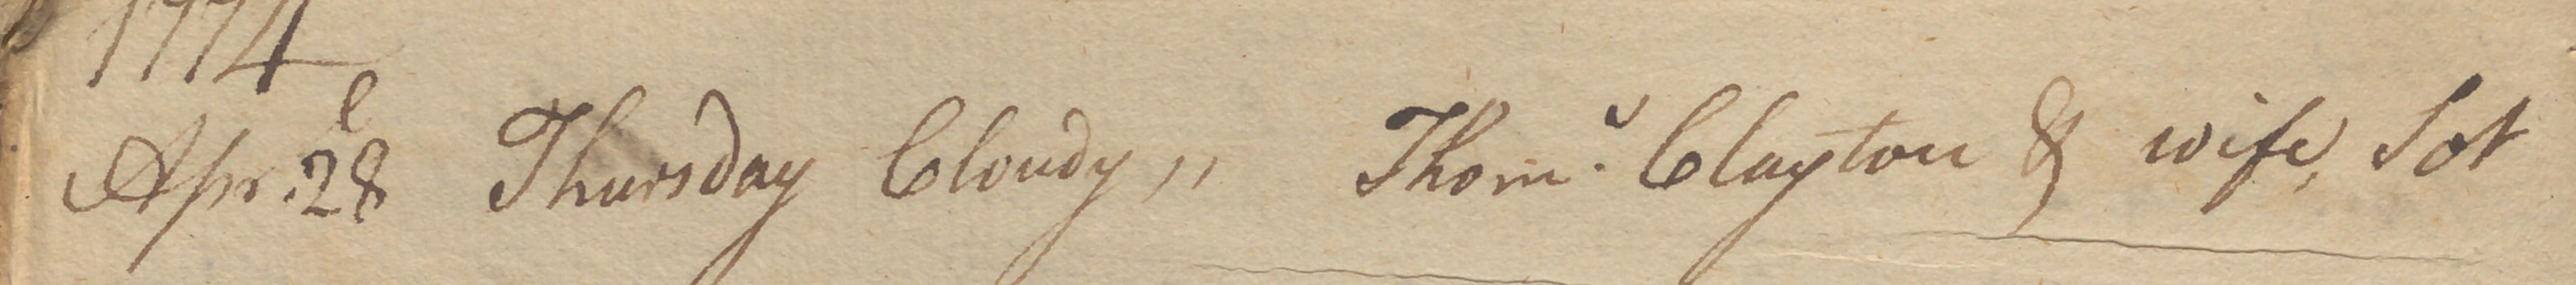Apr^l. 29 Thursday Cloudy, Thom^s. Clayton & wife, Set
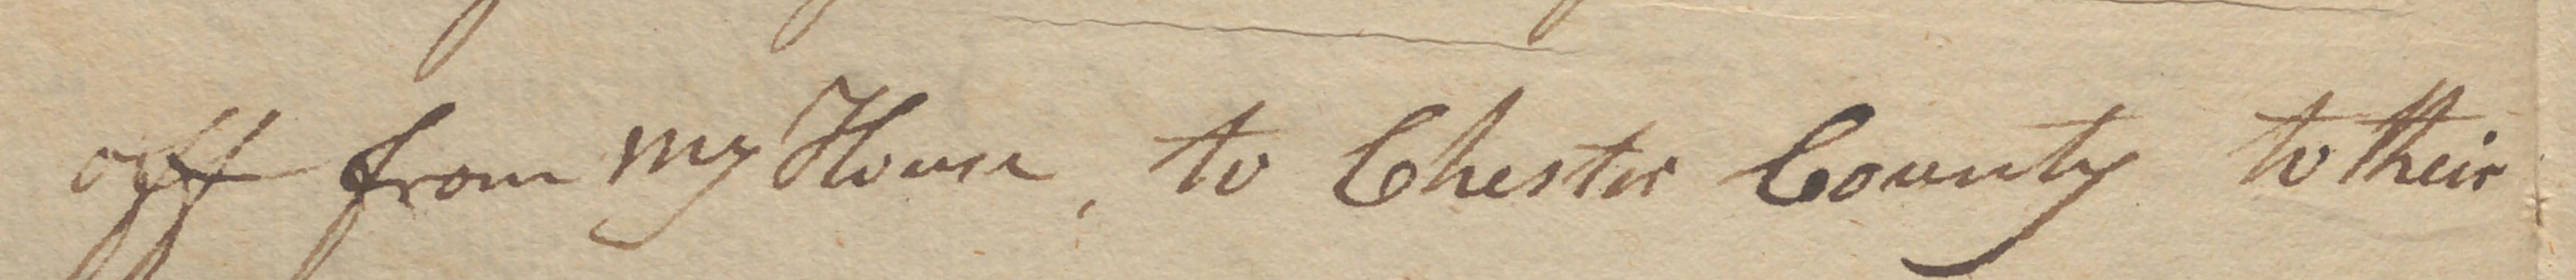off from My House, to Chester County to their
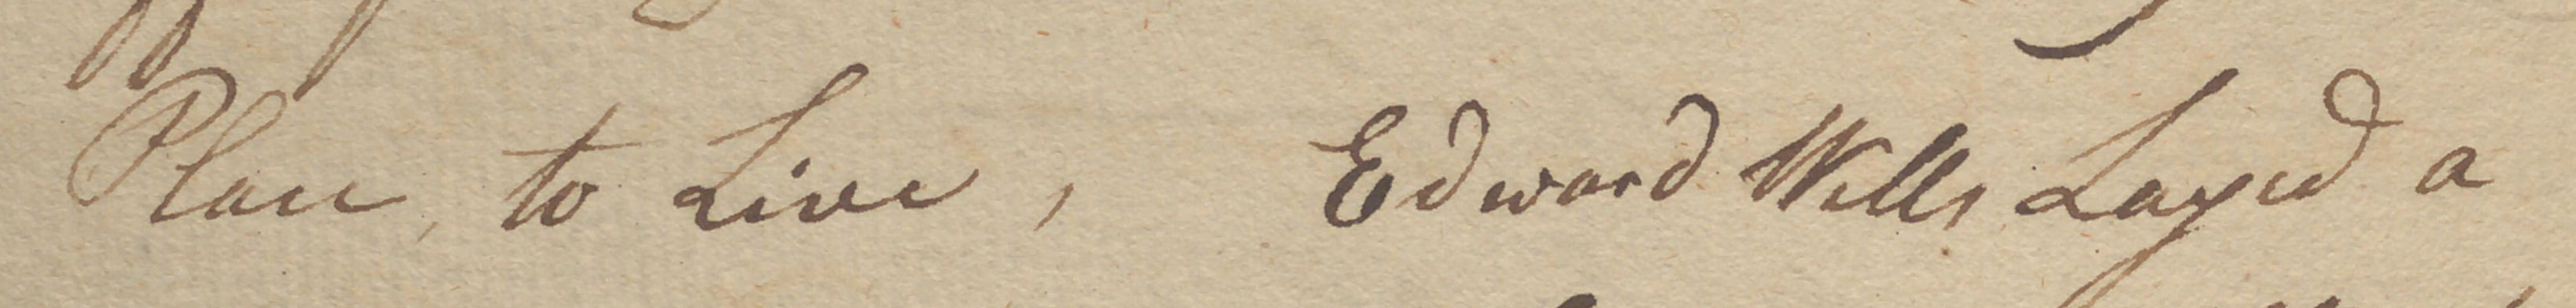Place to Live, Edward Wills Layed a
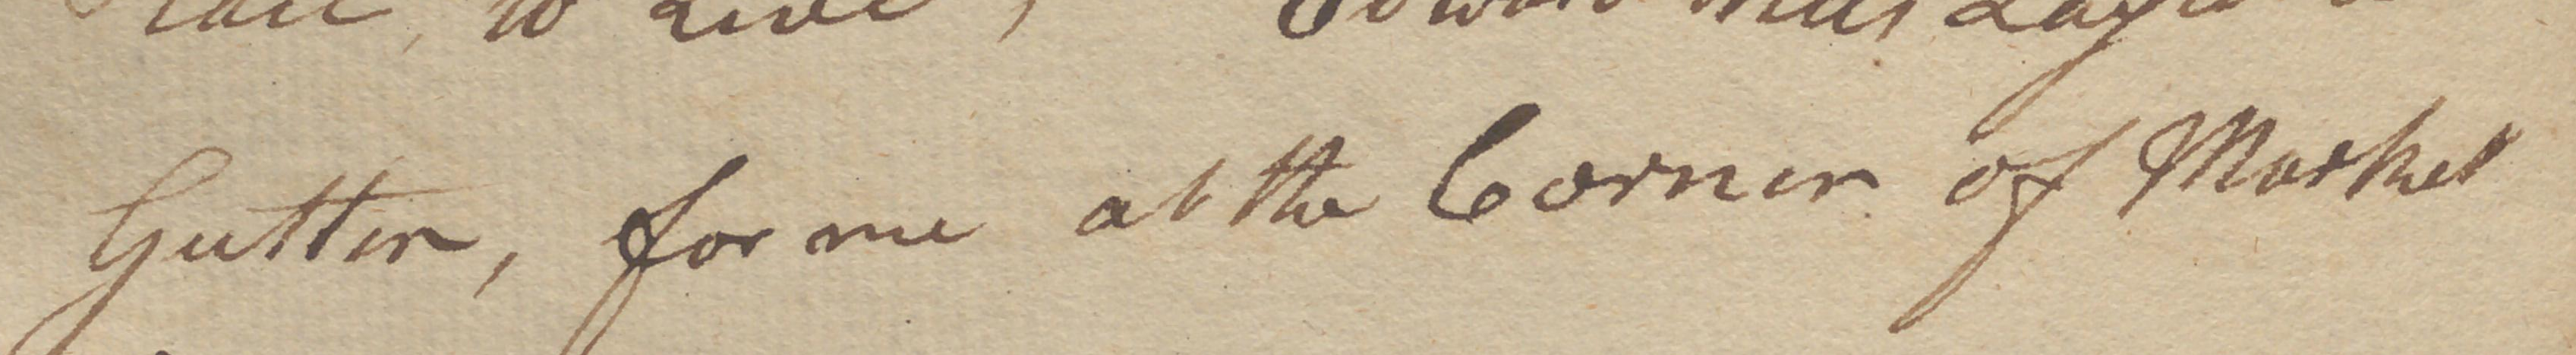Gutter, for me at the Corner of Market
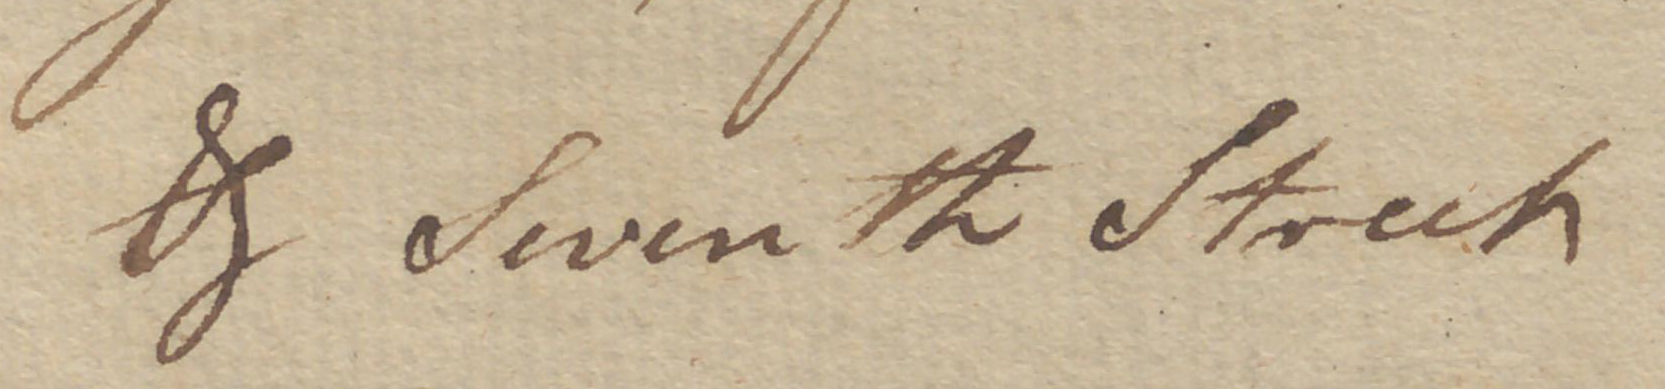& Seventh Streek
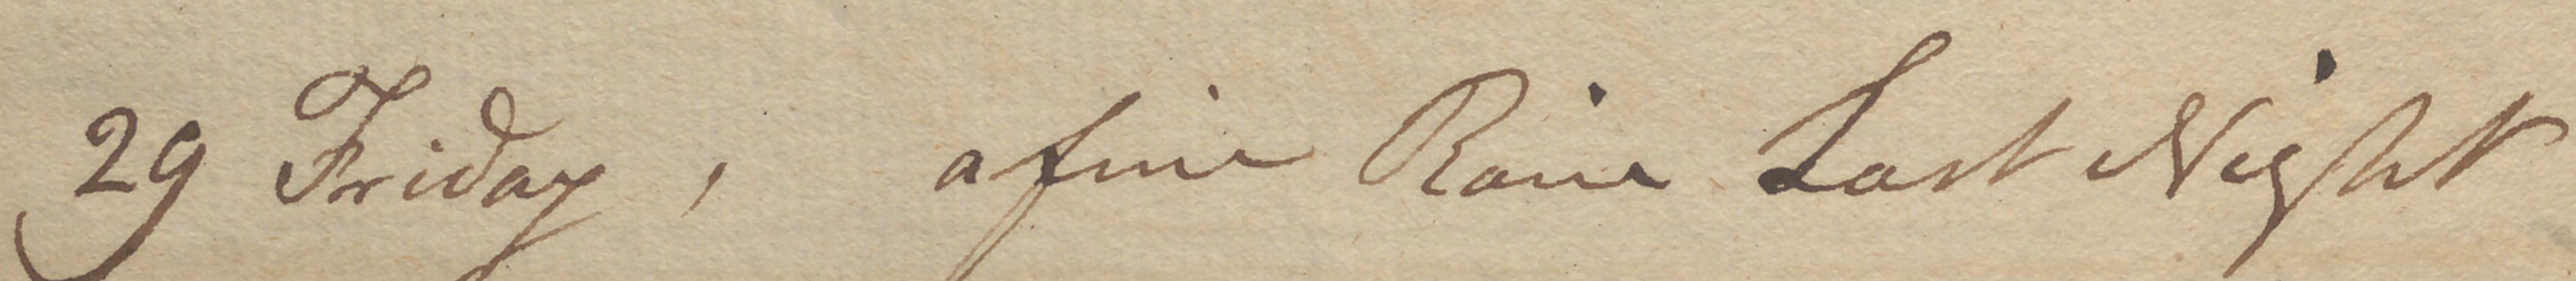29 Friday, a fine Rain Last Night
